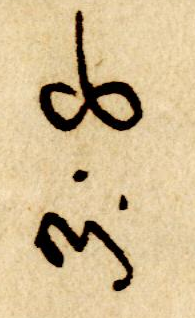3:8
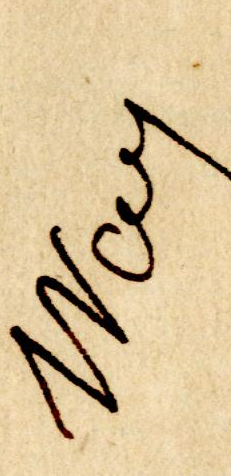Way
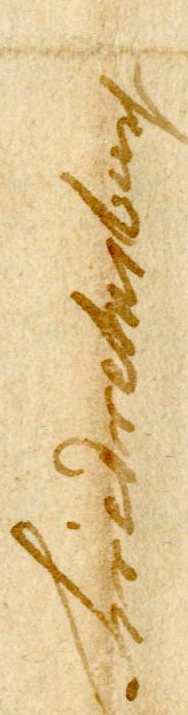Fredericksburg
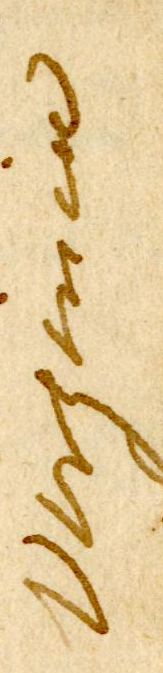Virginia
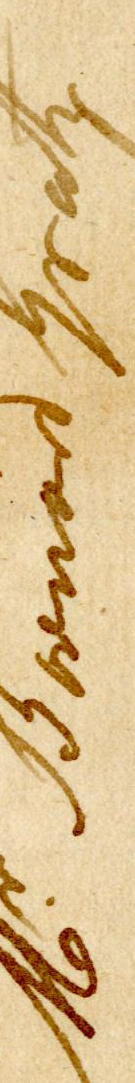M^r Barnard Gratz
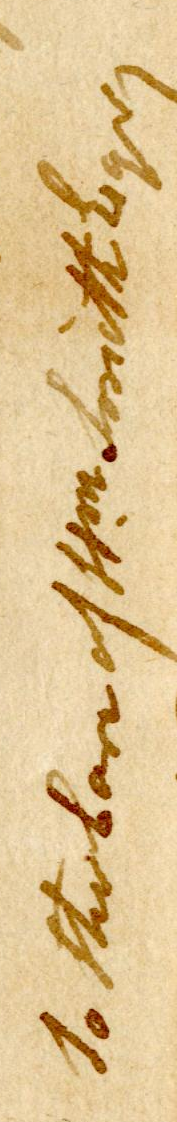to the care of H^m Smith Esq^r
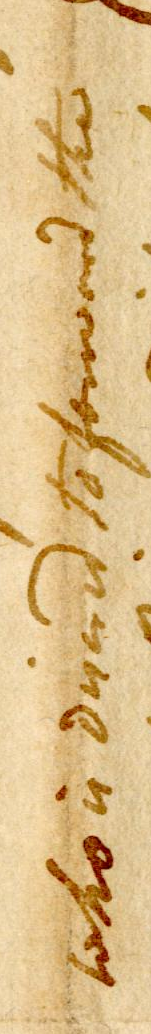who is desird to forward the
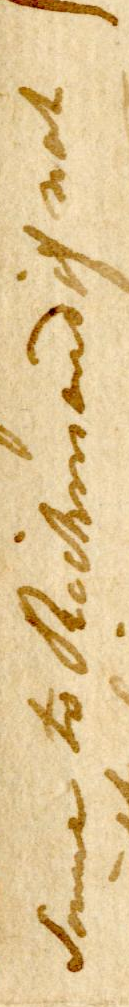same to Richmond if not
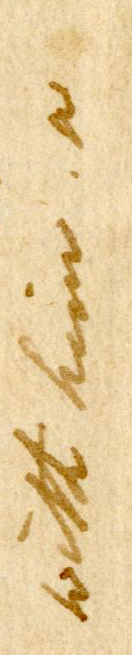with him a
